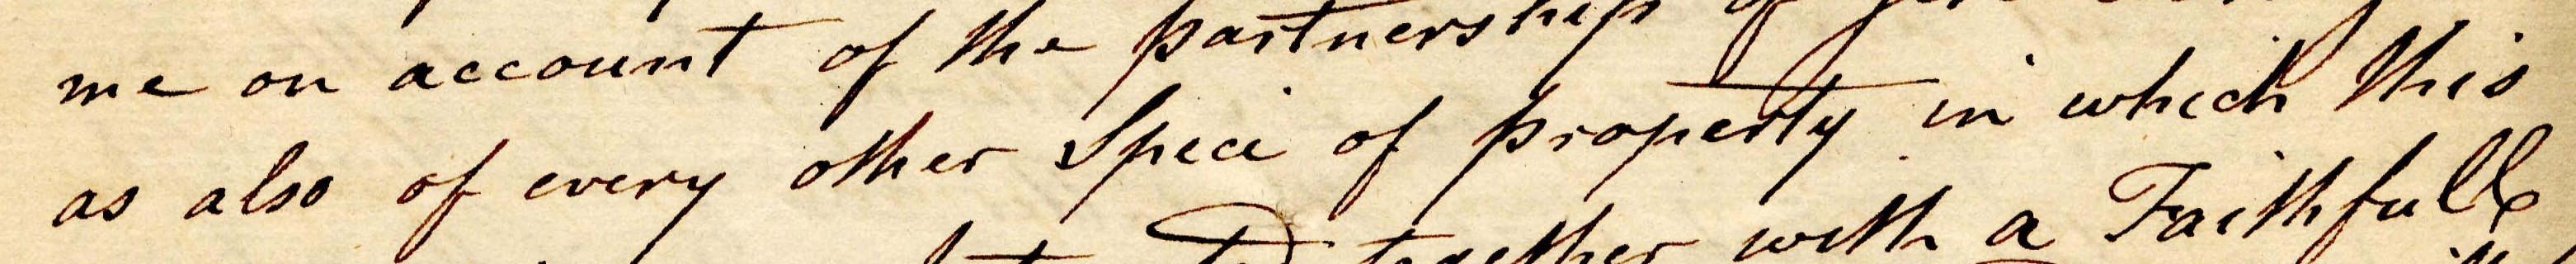as also of every other Specie of property in which this
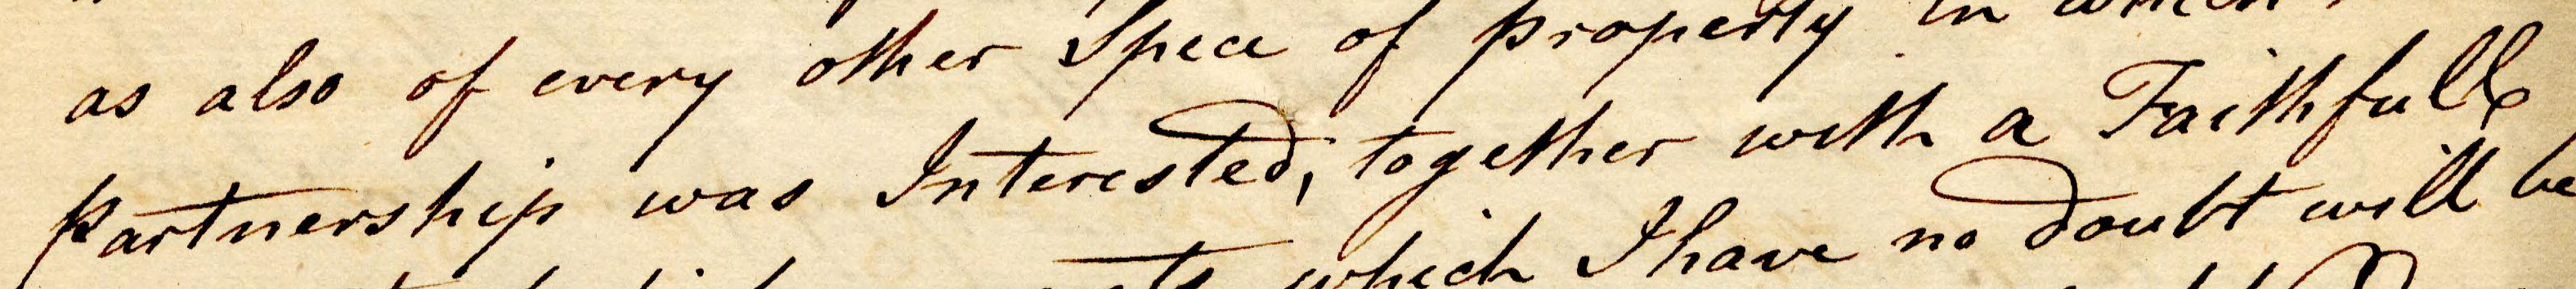Partnership was Interested; together with a Faithfull
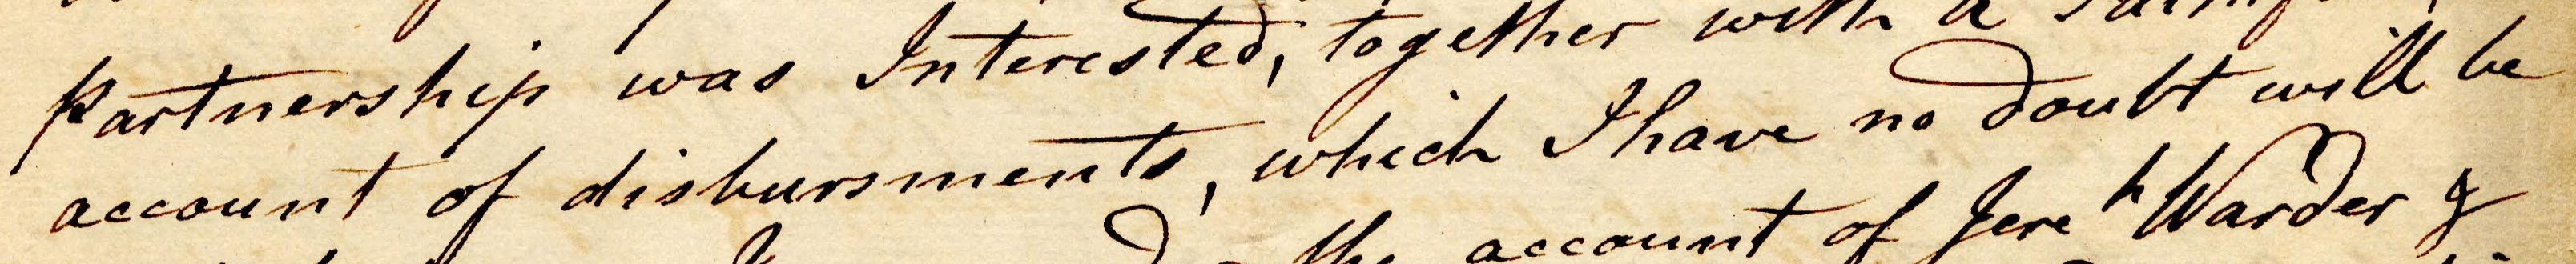account of disbursments, which I have no doubt will be
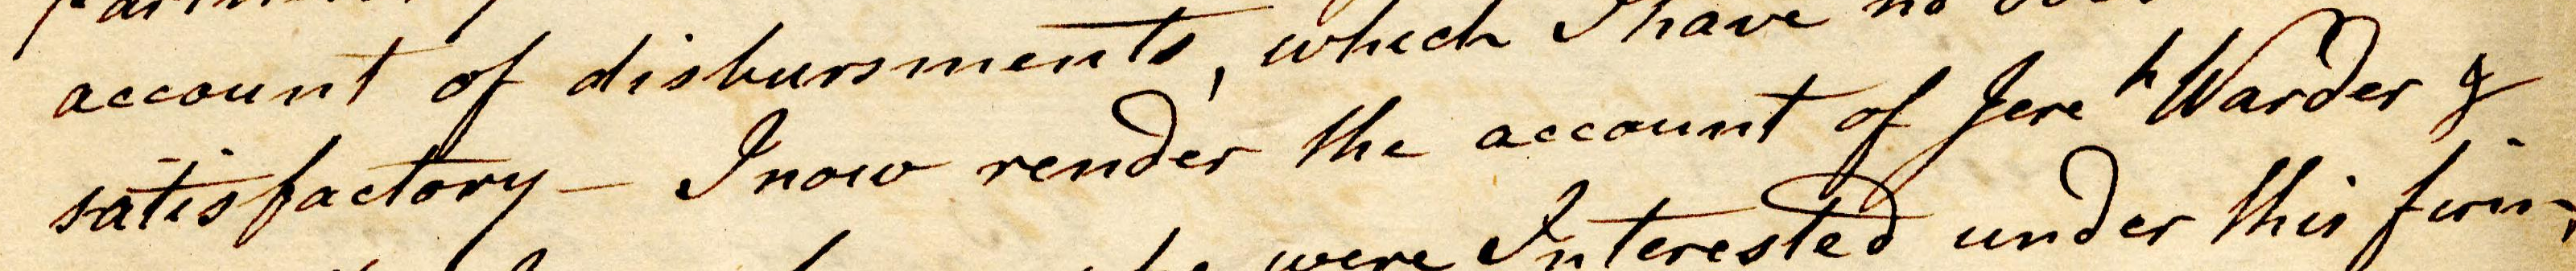satisfactory. I now render the account of Jer^t Warder &
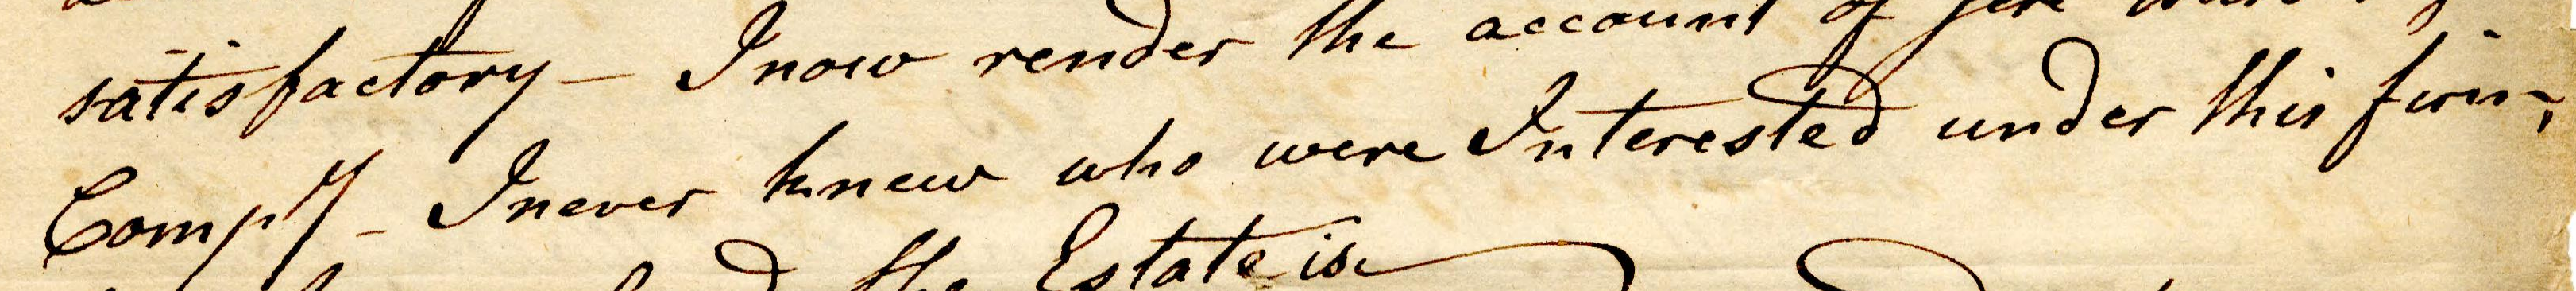Comp^y. I never knew who were Interested under this fair,
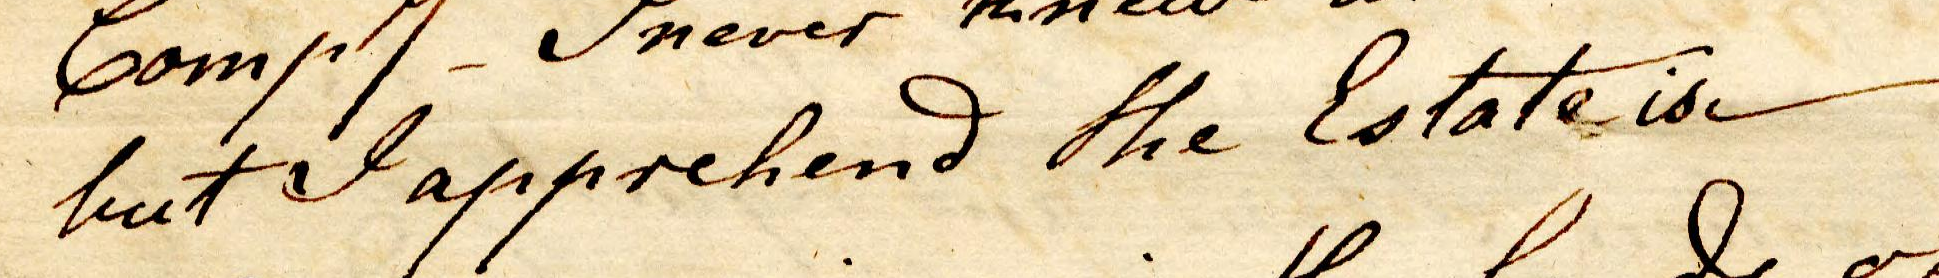but I apprehend the Estate is
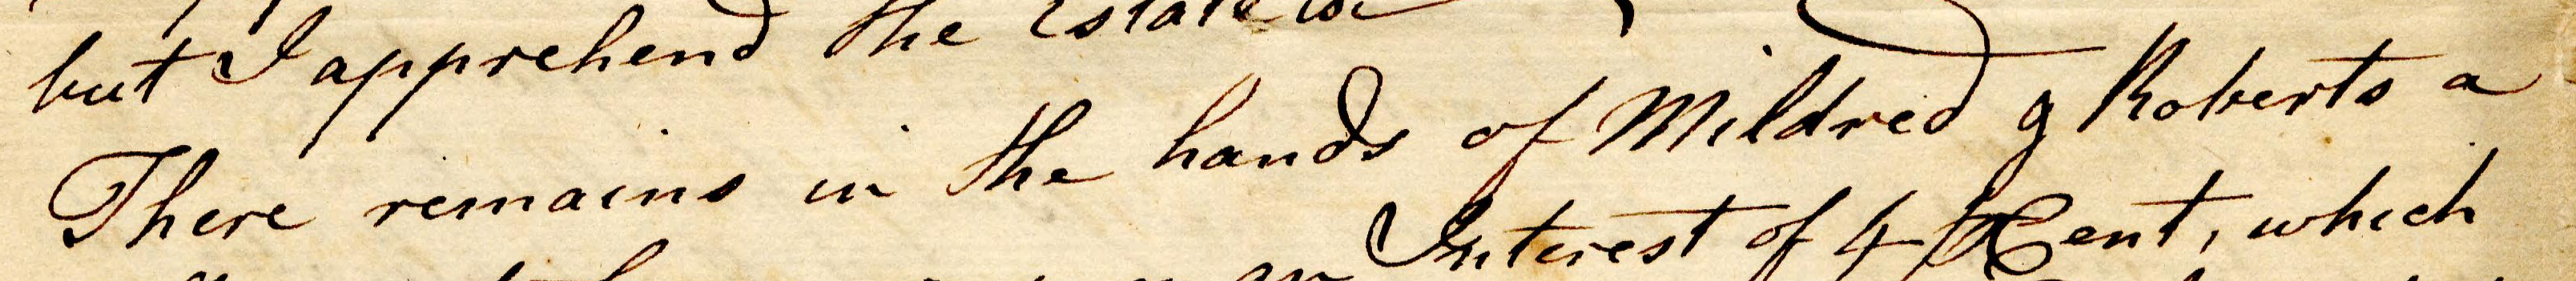There remains in the hands of Mildred & Roberts a
